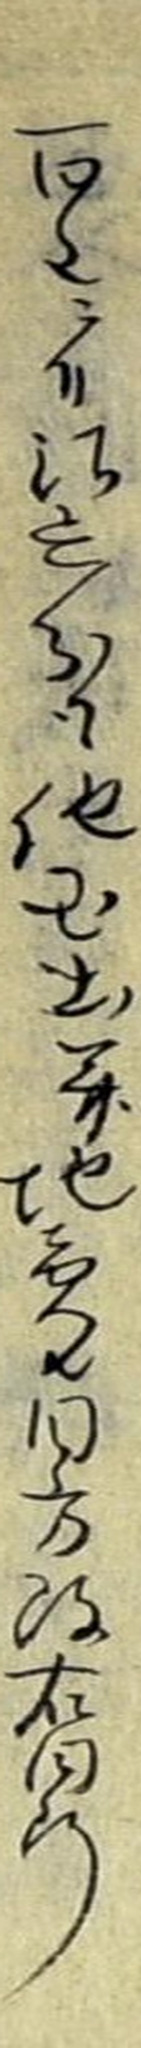百匁ニ付銀壱分ツヽ他国出并地売共目方改右同断
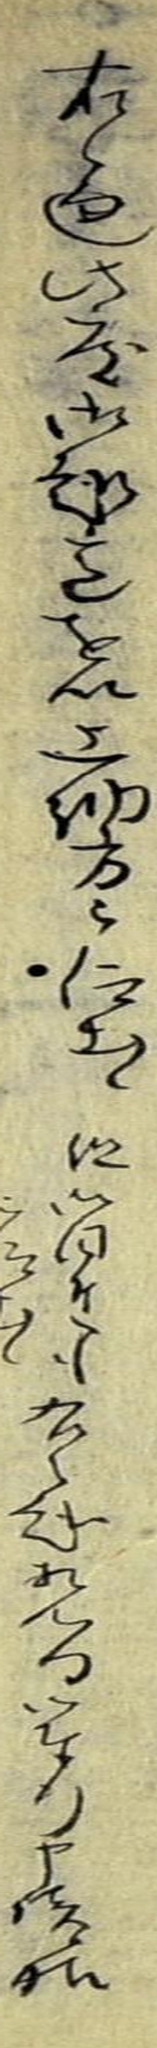右之通此度御趣意を以上納方被仰出候但御目付へも有之趣相心得御奉行申談候様
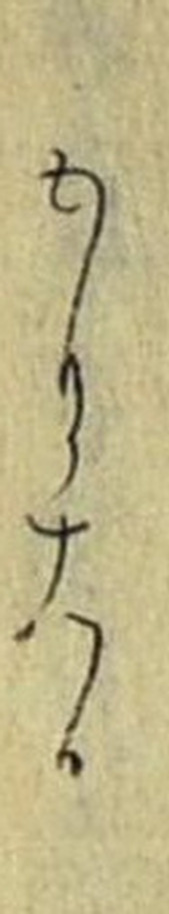五月十八日

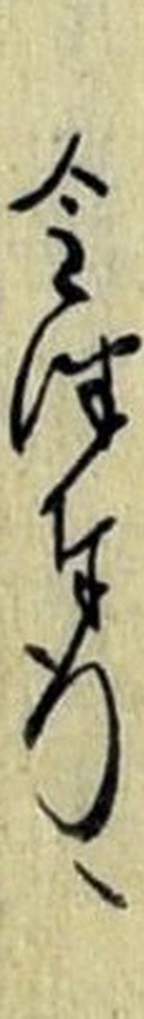金津奉行へ
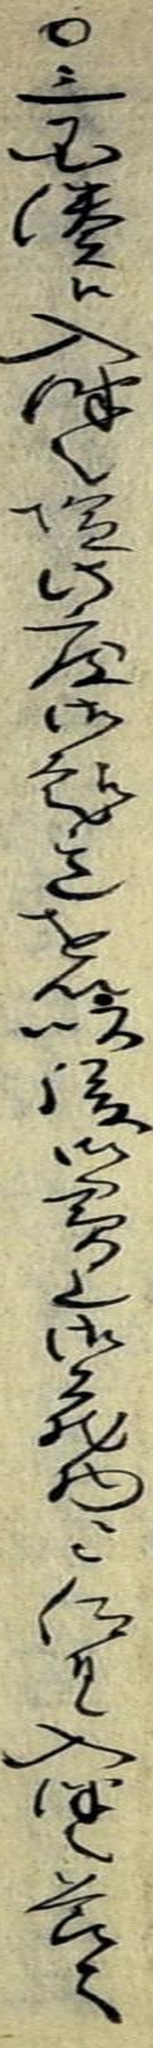○三国湊江入津之塩此度御趣意を以以後御買上御蔵物へ被仰付候入津之節者
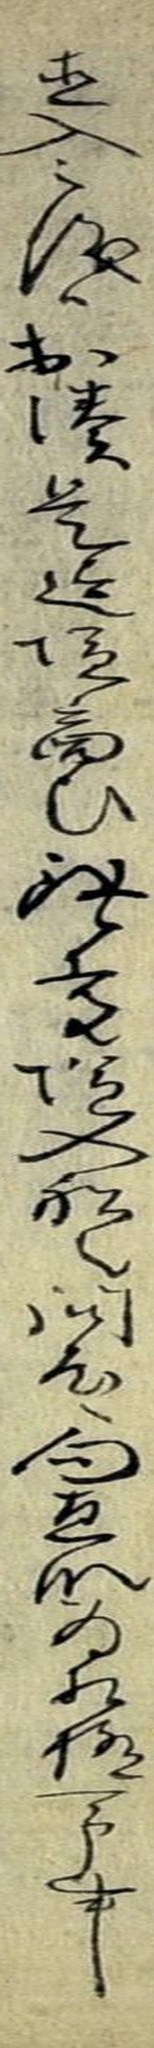直入之儀ハ於湊是迄塩商ひ致候者共塩入船之問屋へ向直段為相極可申事
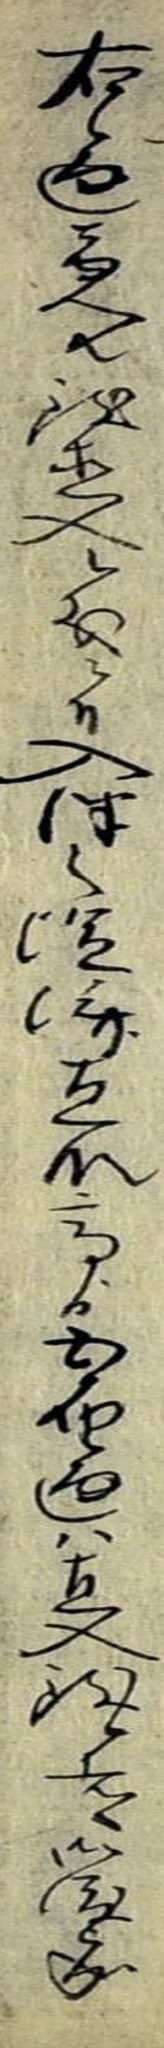右之通商人共致直入候義ニ付入津之塩済直段高ゟ五厘通ハ直入致候者へ御渡被成
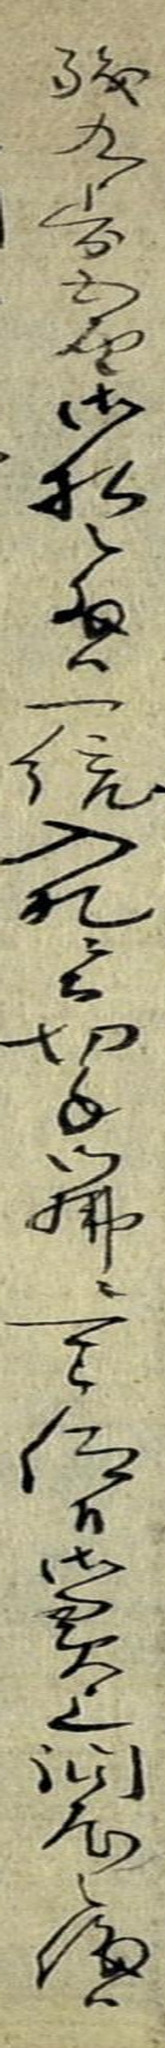残九歩五厘御払之義ハ一統入札ニ而切手御払ニ可被仰付御買上問屋之儀ハ
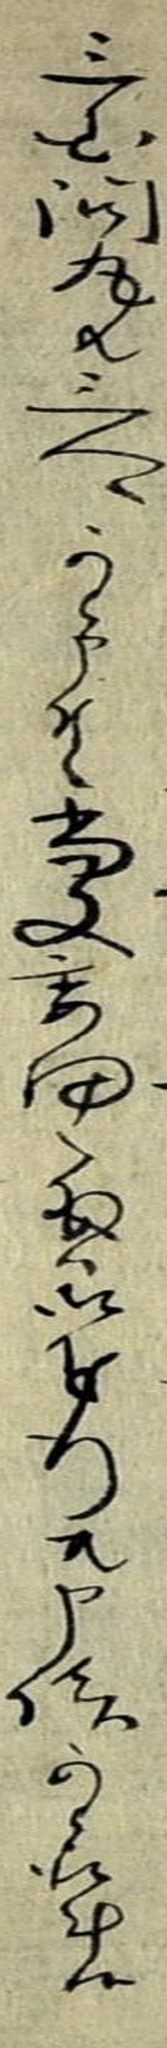三国問丸共三人へ可被申付候尚又委細之義ハ奉行共申談可被取計候
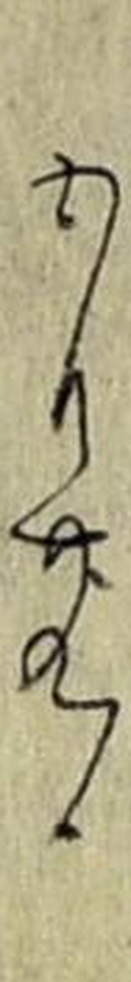五月廿九日
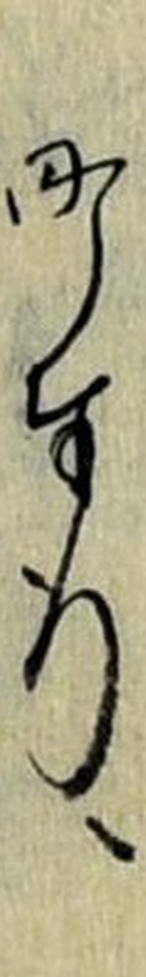御奉行
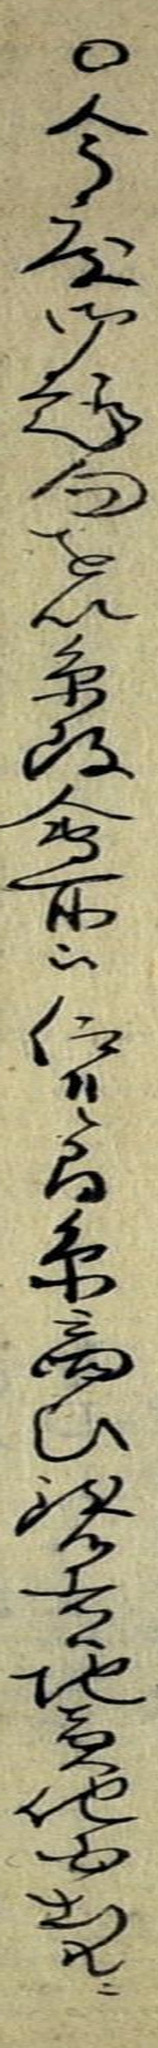○今度御趣向を以糸改会所被仰付候間糸商ひ致候者ハ地売他国出共ニ
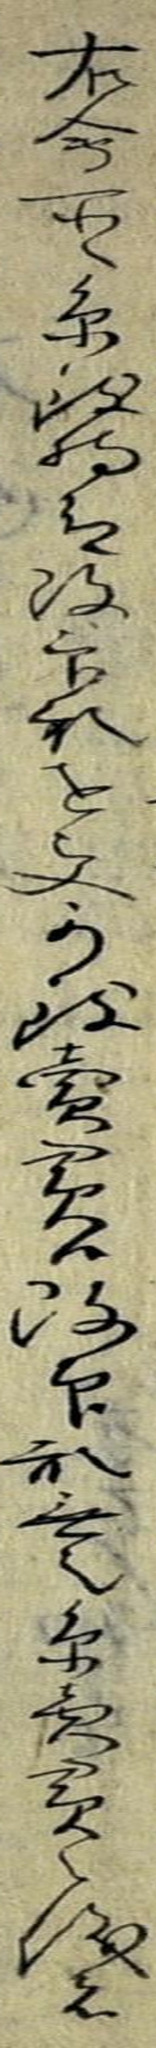右会所へ糸致持参改印形を被入可致売買ハ改印形無之糸売買之儀者
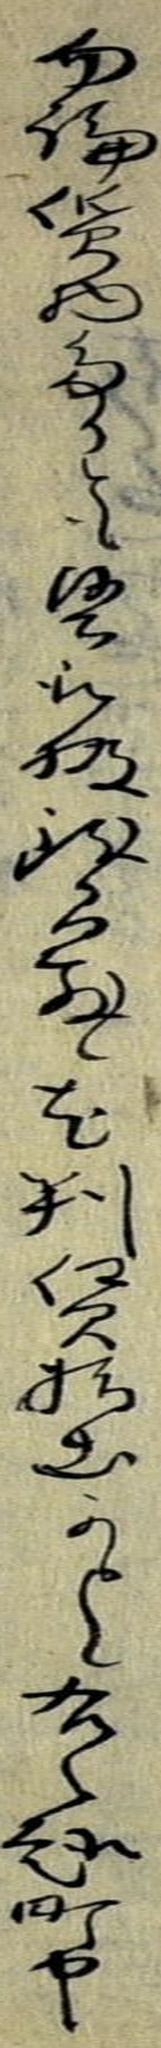勿論質物たりとも堅取扱致間敷候尤判賃指出可申候有之趣町中
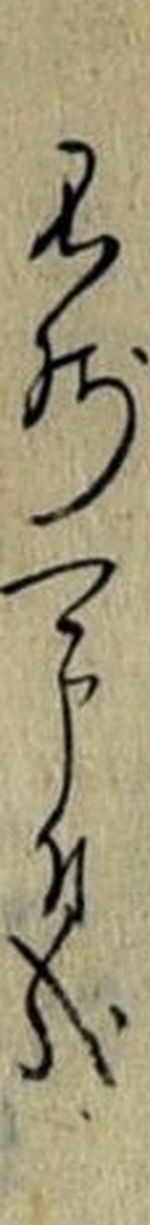不残可申付哉
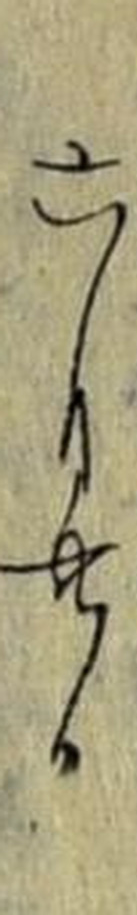六月廿日
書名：命令之部 三
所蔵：福井県文書館 Fukui Prefectural Archives
